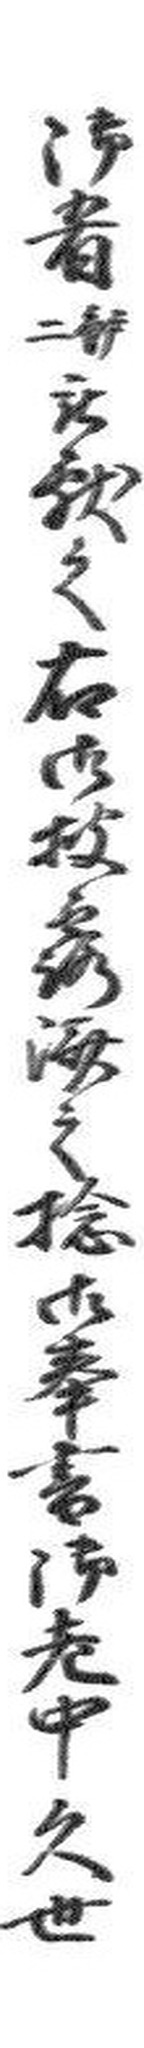御肴鱸二被献之右御披露済之捻御奉書御老中久世

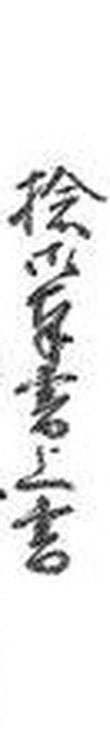捻御奉書上書
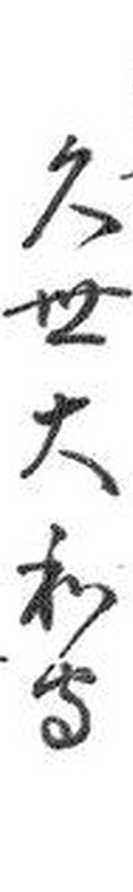久世大和守
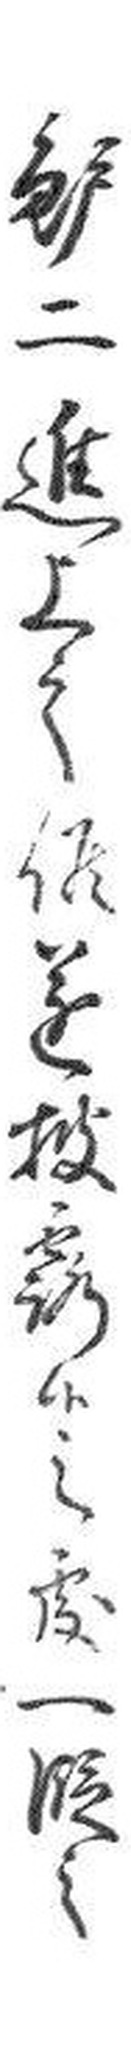鱸二進上之候遂披露候之処一段之
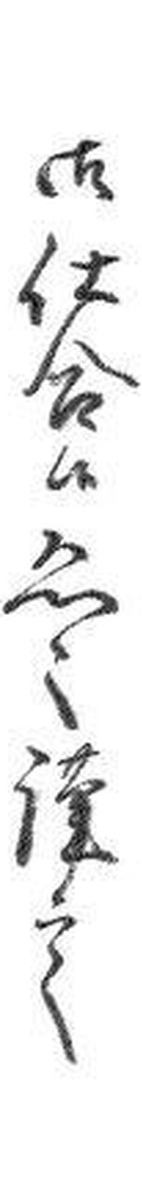御仕合候恐々謹言
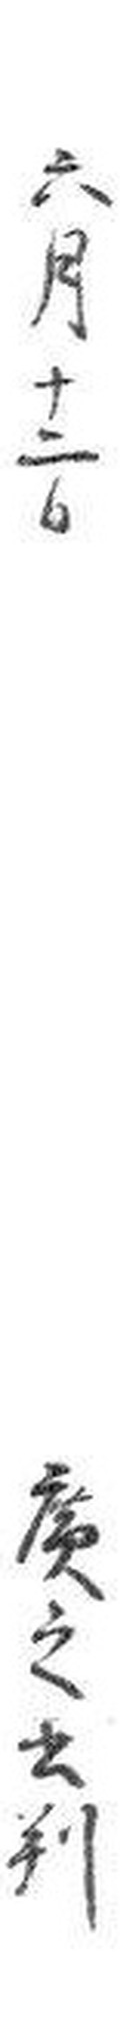六月十二日広之書判
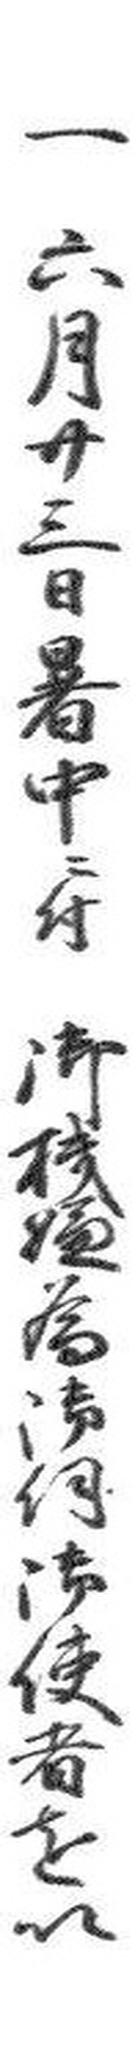一六月廿三日暑中ニ付御機嫌為御伺御使者を以
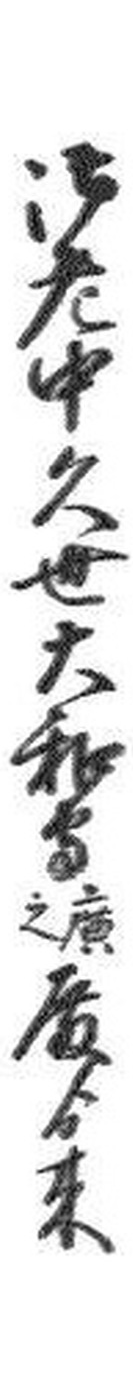御老中久世大和守広之殿ゟ来
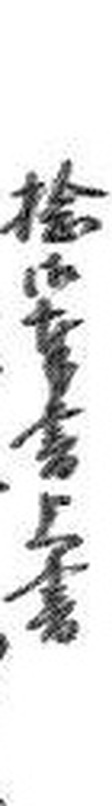捻御奉書上書
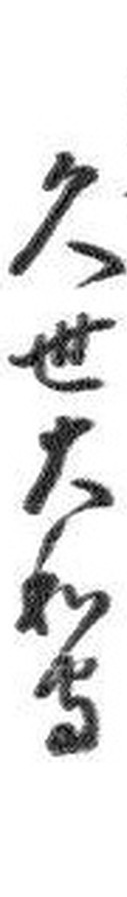久世大和守
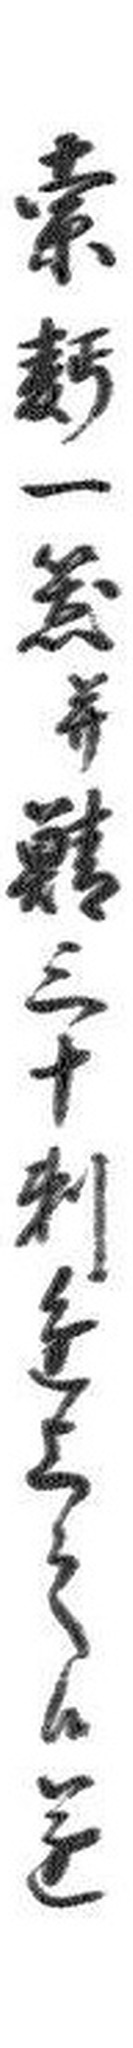索麪一器并鯖三十刺進上之候遂
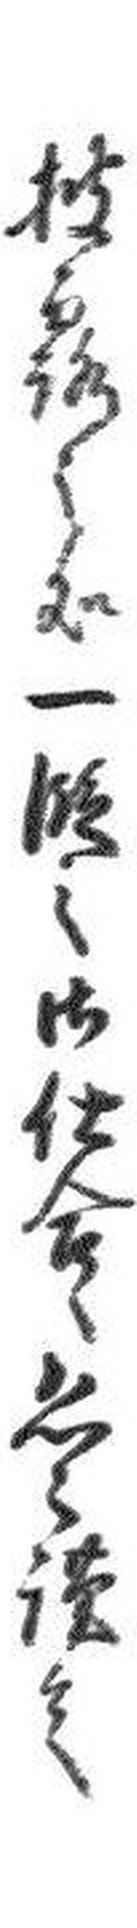披露之処一段之御仕合候恐々謹言
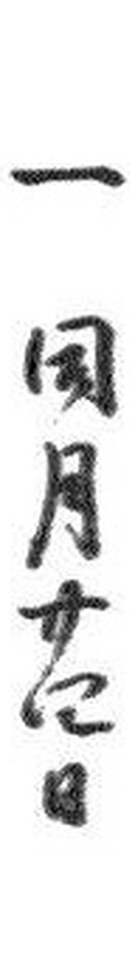一同月二十四日
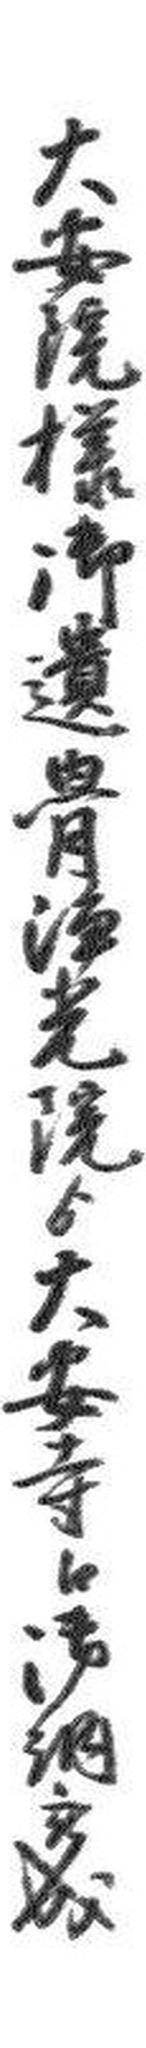大安院様御遺骨浄光院ゟ大安寺江御納被成

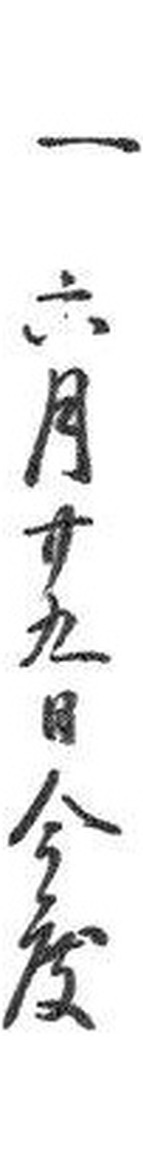一六月廿九日今度
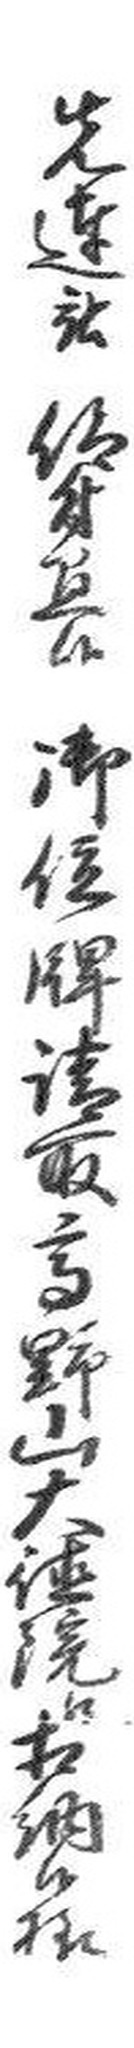先達被仰付置候御位牌請取高野山大徳院江相納候様
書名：家譜 十一 昌親公 従延宝二年到延宝四年八月
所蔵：福井県文書館 Fukui Prefectural Archives
